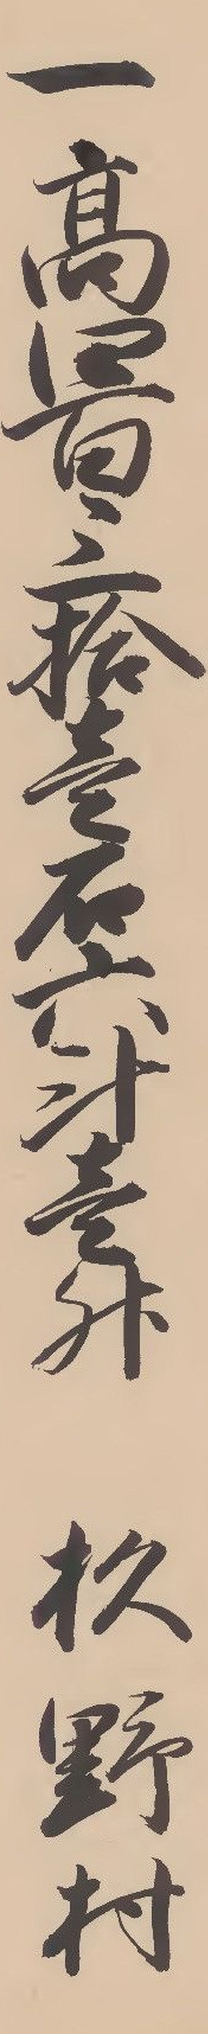一高四百三拾壱石六斗壱升杉野村
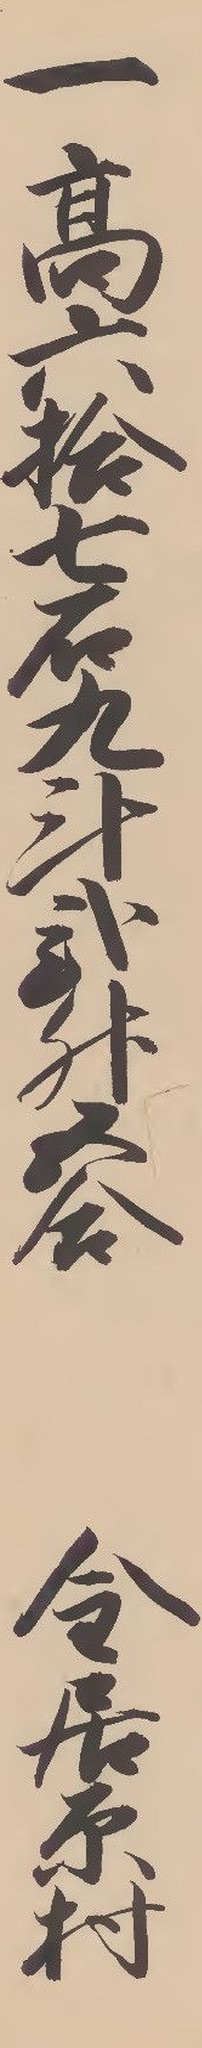一高六拾七石九斗弐升五合金居原村

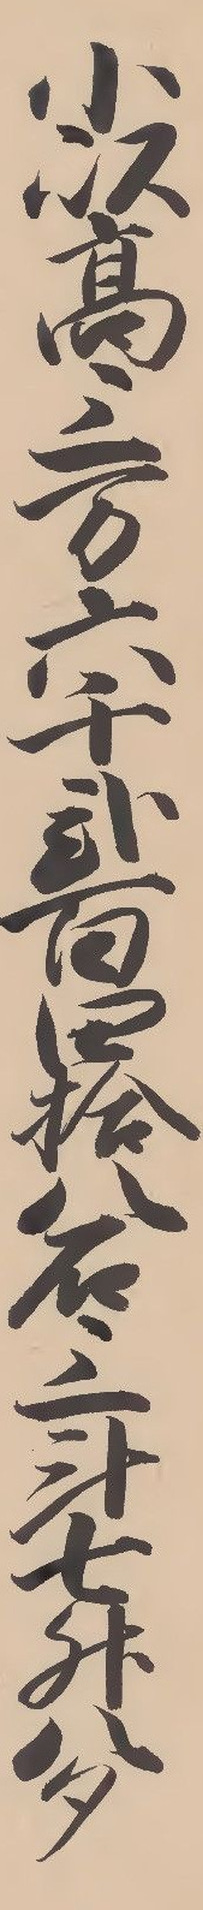小以高三万六千弐百四拾八石三斗七升八勺
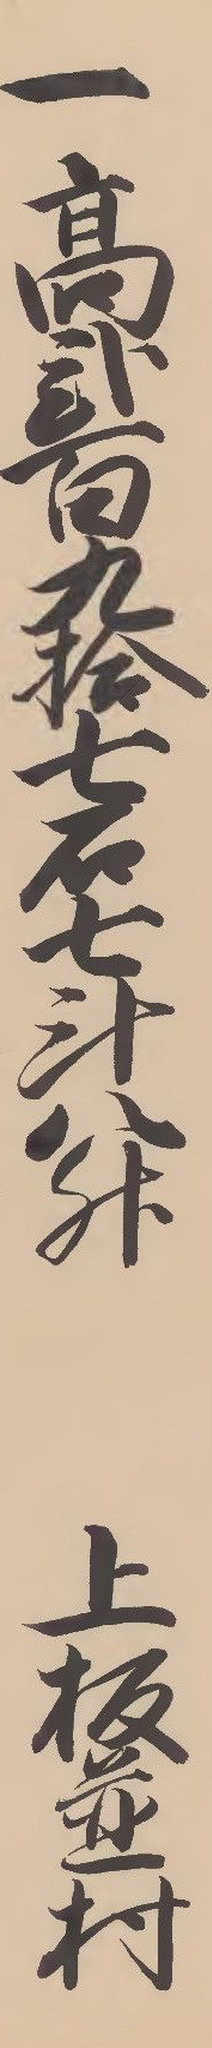一高弐百九拾七石七斗八升上板並村
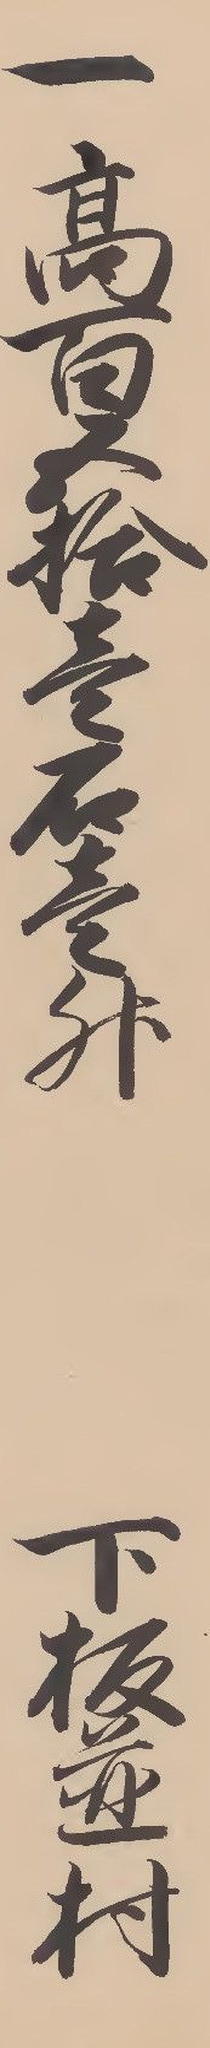一高百五拾壱石壱升下板並村
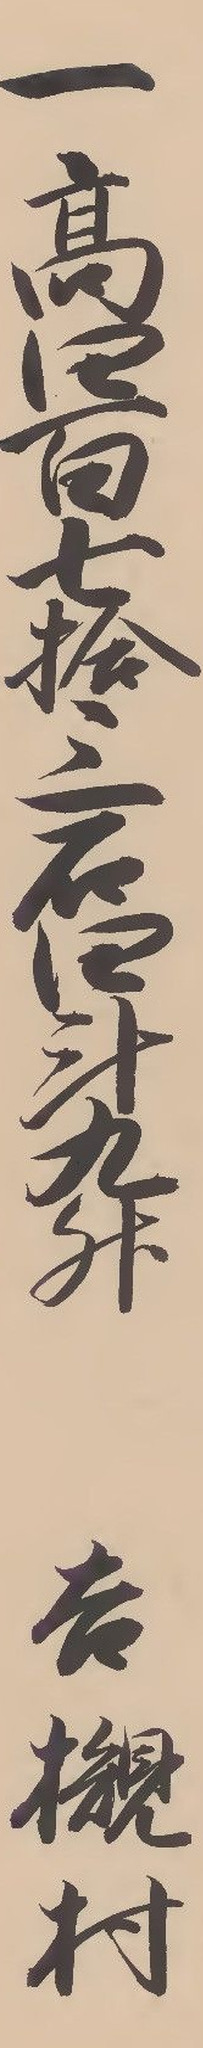一高四百七拾三石四斗九升吉槻村

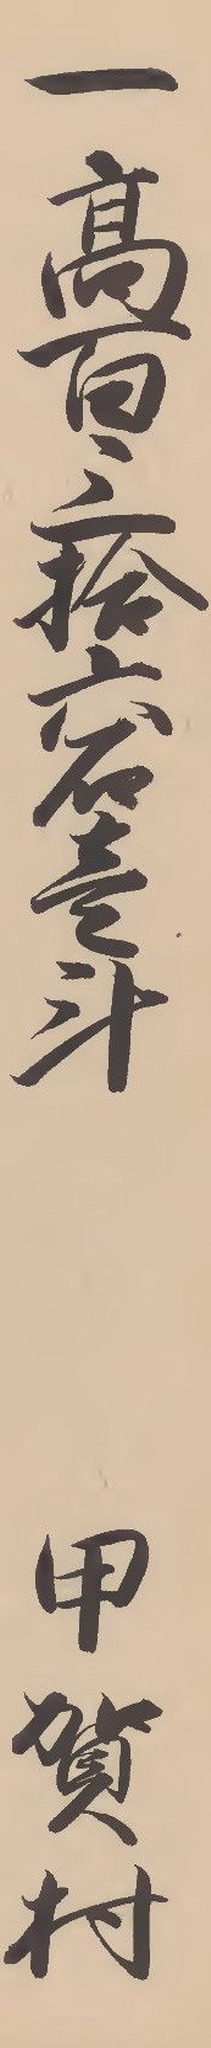一高百三拾六石壱斗甲賀村
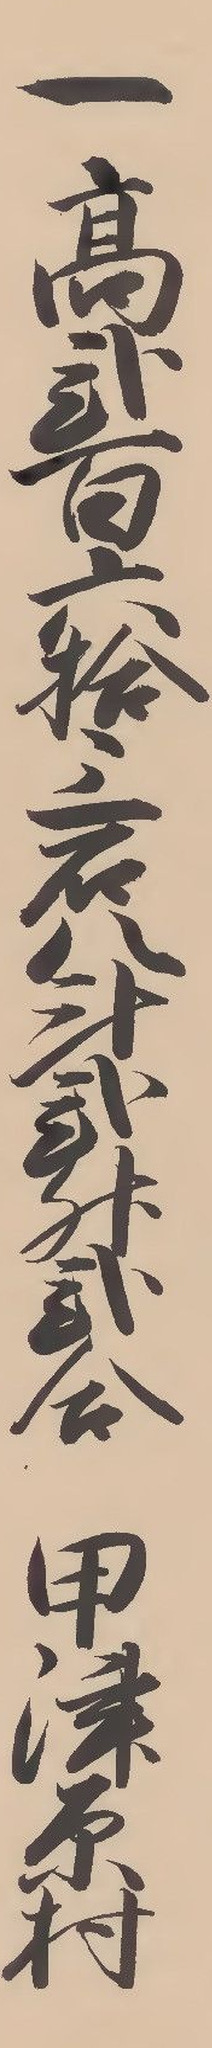一高弐百六拾三石八斗弐升弐合甲津原村
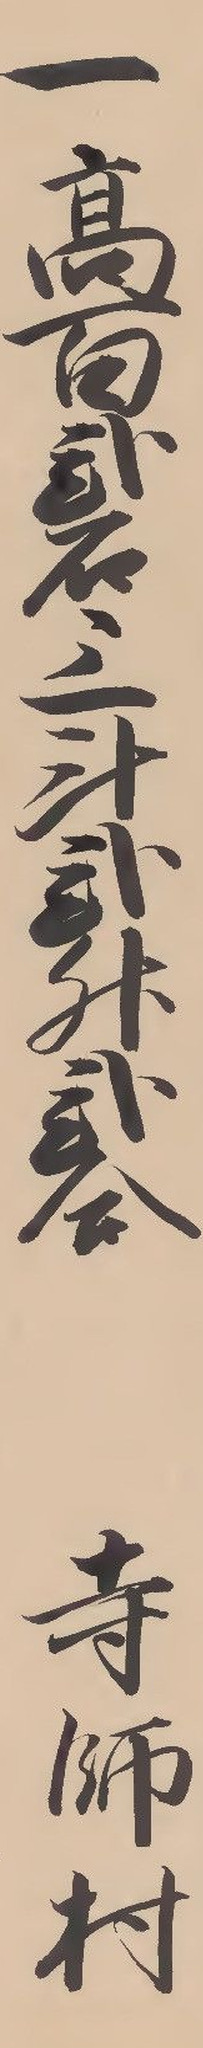一高百弐石三斗弐升弐合寺師村
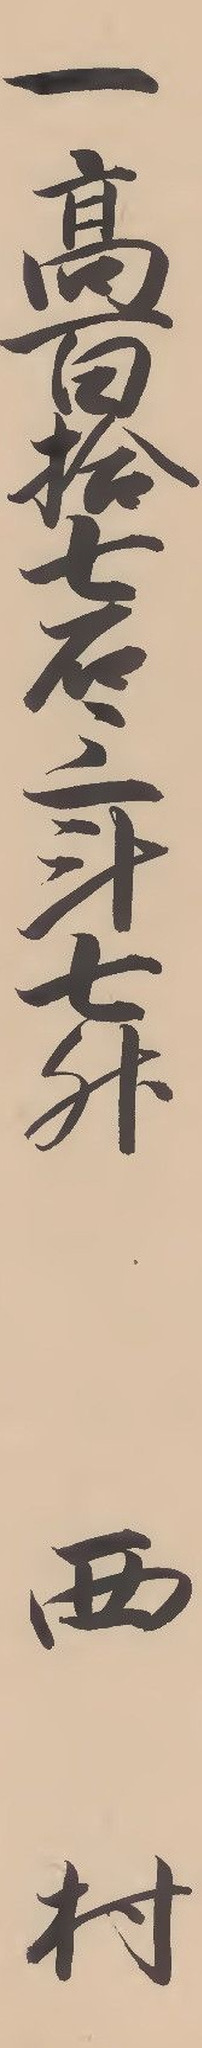一高百拾七石三斗七升西村
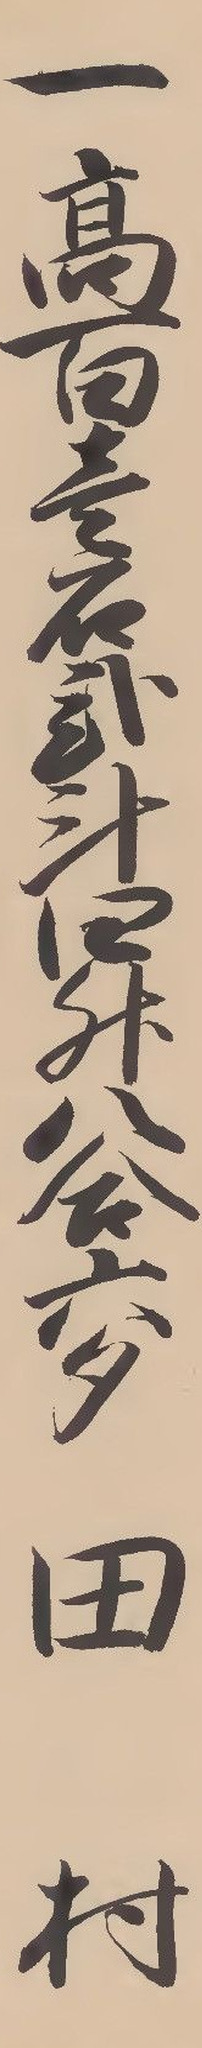一高百壱石弐斗四升八合六勺田村
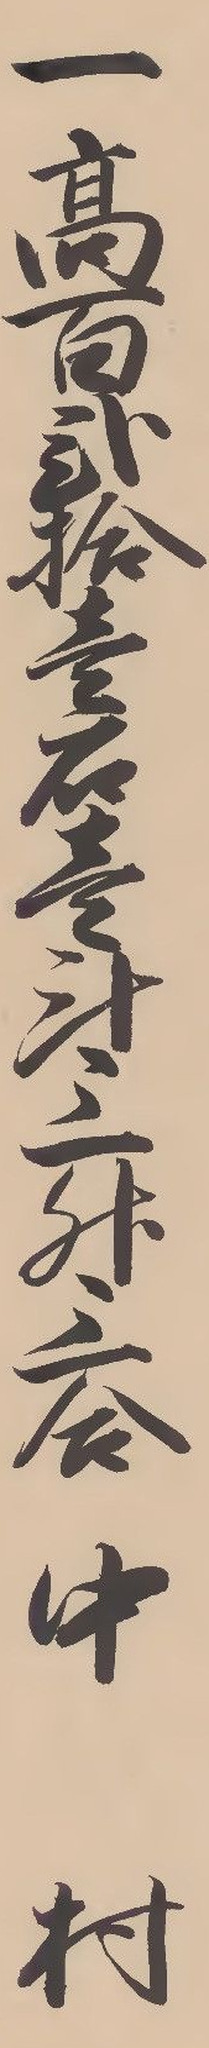一高百弐拾壱石壱斗三升三合中村

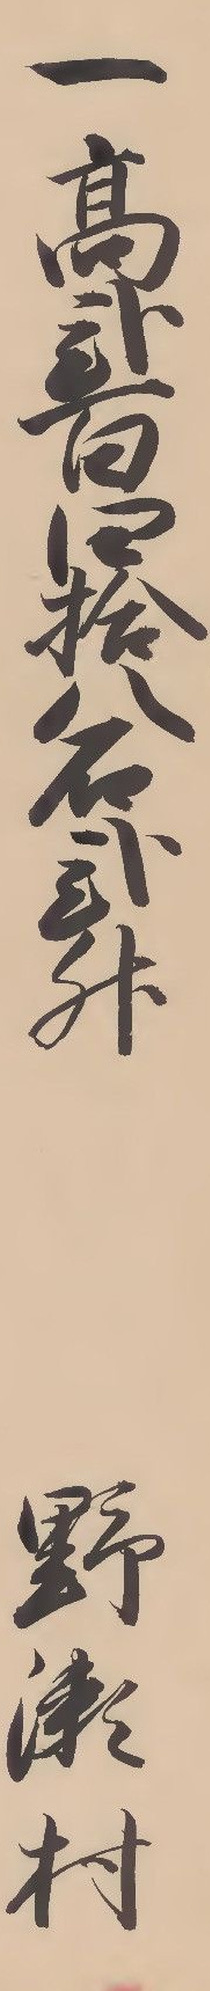一高弐百四拾八石弐升野瀬村
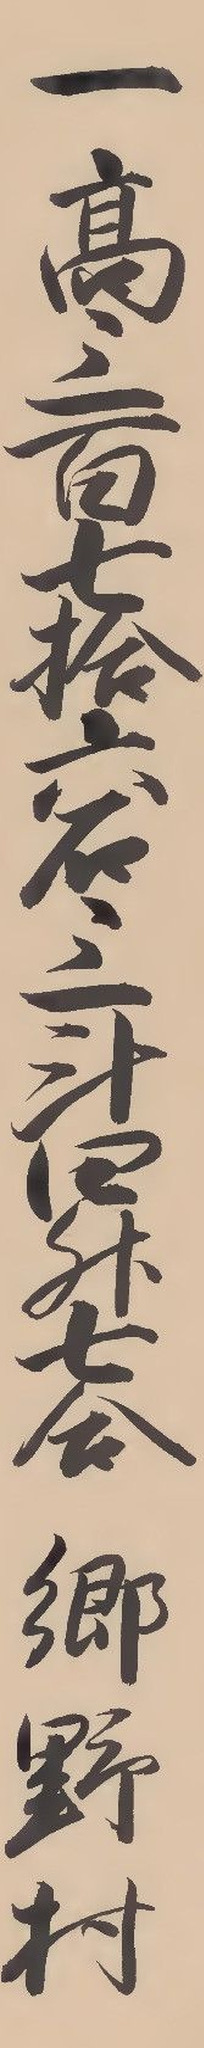一高三百七拾六石三斗四升七合郷野村
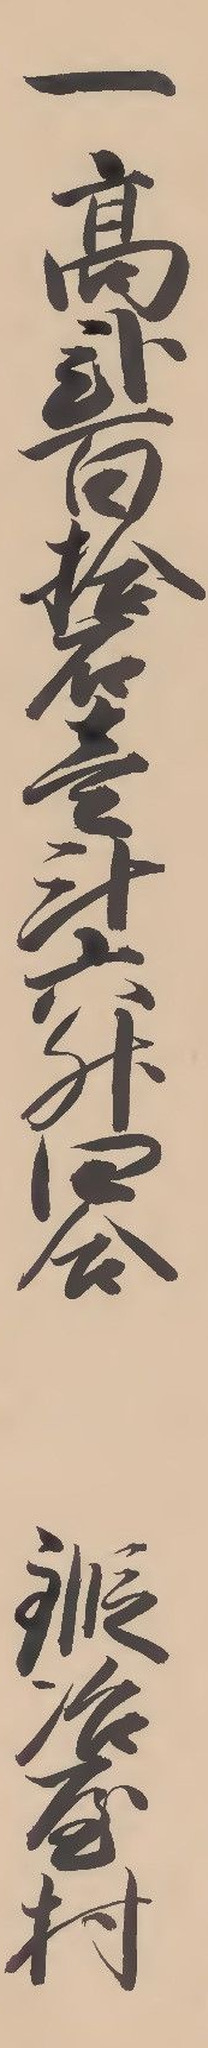一高弐百拾石壱斗六升四合鍛冶屋村
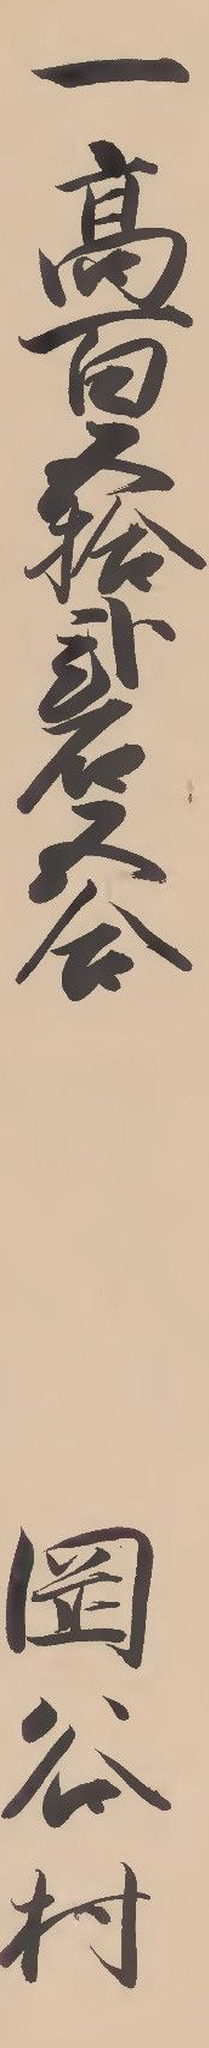一高百五拾弐石五合岡谷村
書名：近江国郷帳
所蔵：国立公文書館 National Archives of Japan
